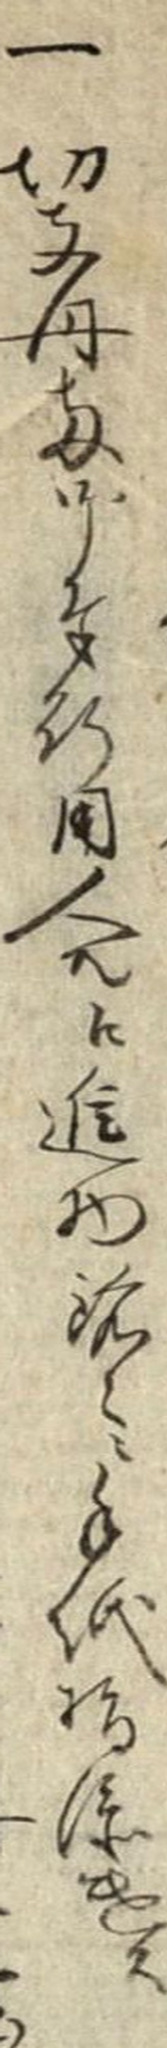一切支丹両御奉行用人共へ進物銘々に手紙指添遣す
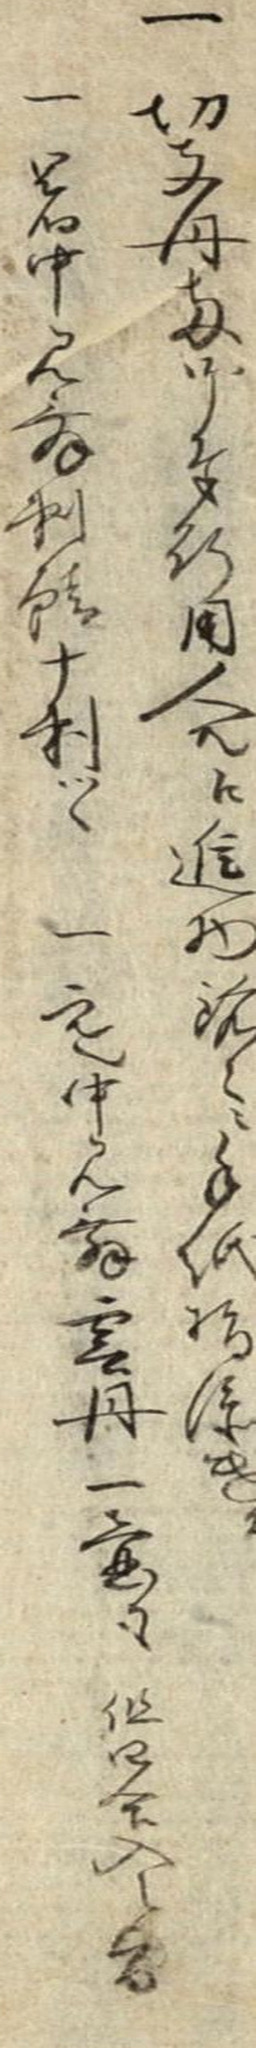一暑中見舞刺鯖十刺ツヽ一寒中見舞雲丹一壺ツヽ但四合入之旨

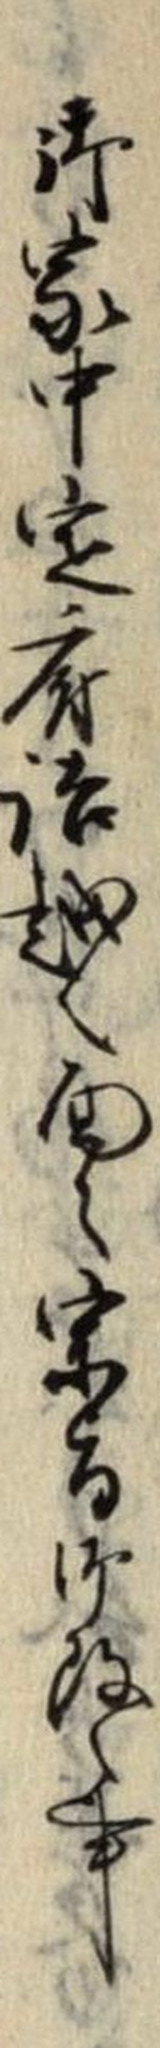御家中定府詰越之面々宗旨御改之事
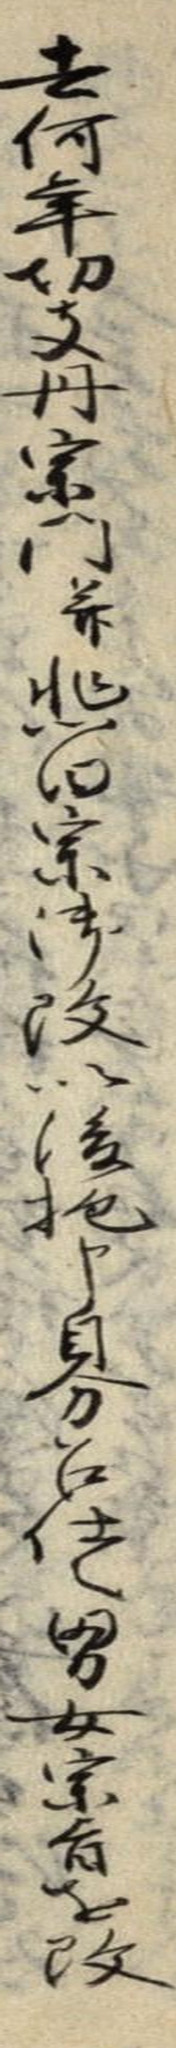去何年切支丹宗門并悲田宗御改以後抱申自分召仕之男女宗旨を改
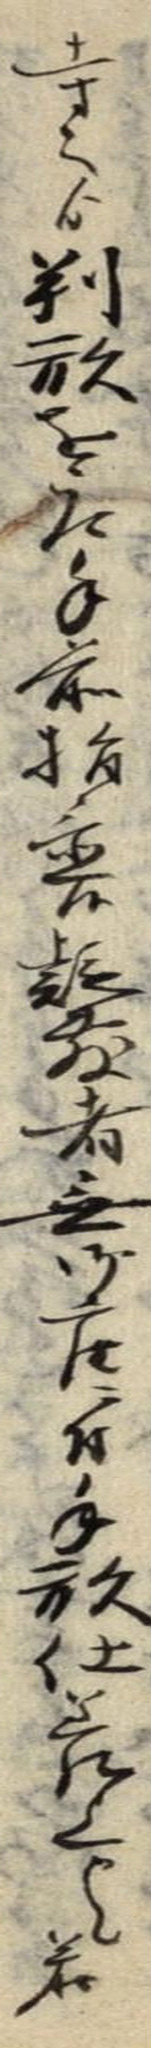寺々より判形を取手前指置候疑敷者無御座に付手形仕差上申候若
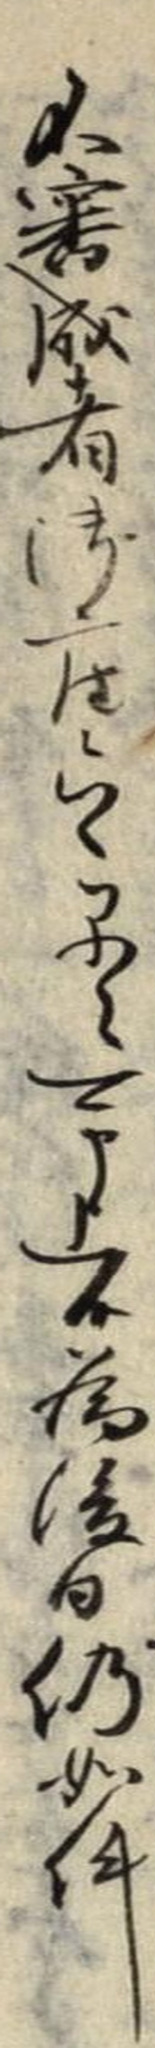不審成者御座候はゝ品々可申上候為後日仍如件
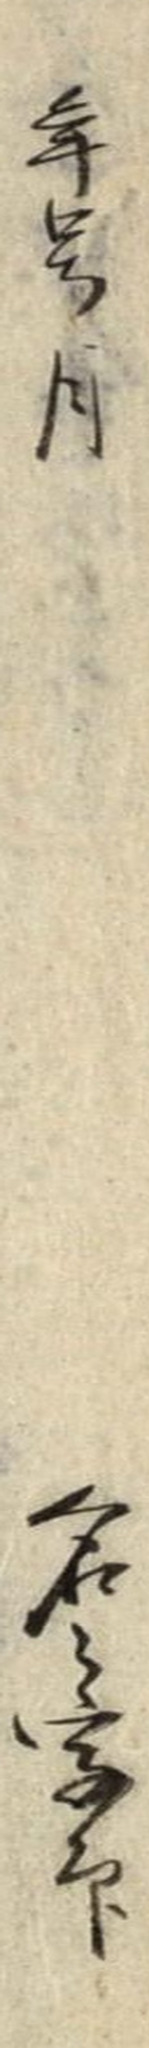年号月名と字印
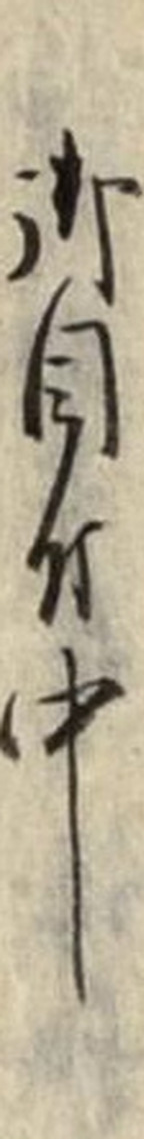御目付中
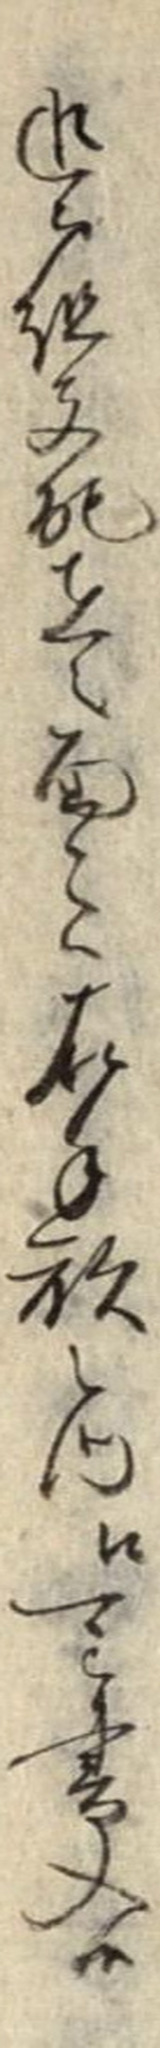追て組支配在之面々は右手形之内江可被書入候
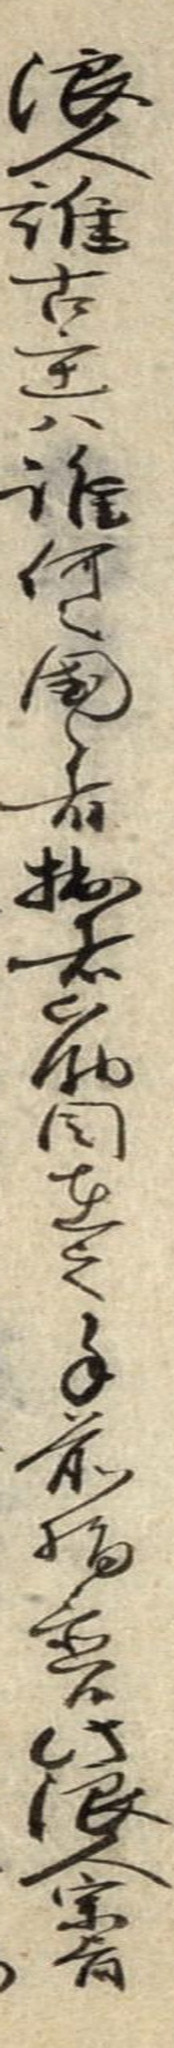浪人誰これは誰何之国之者拙者筋目在之手前指置候此浪人宗旨
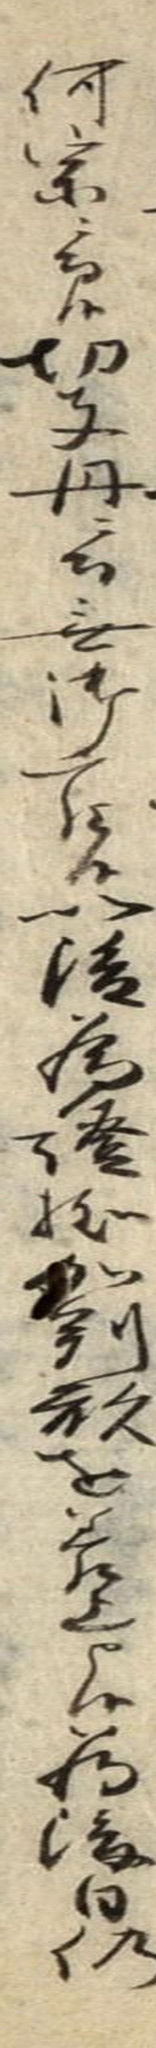何宗にて候切支丹にて無御座候以後為證拠加判形を差上申候為後日仍

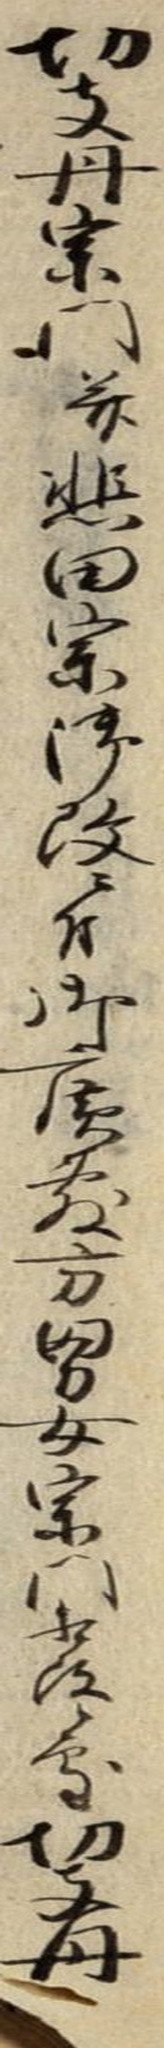切支丹宗門并悲田宗御改に付御広敷方男女宗門相改候処切支丹
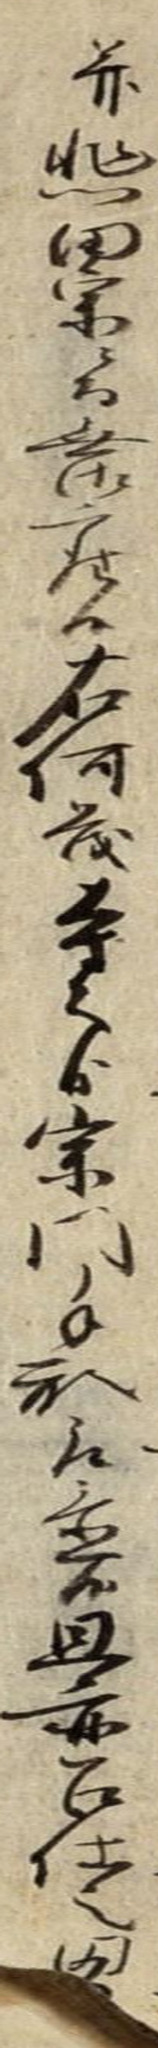并悲田宗にて無御座候右何も寺々ゟ宗門手形取置候且亦召仕之男
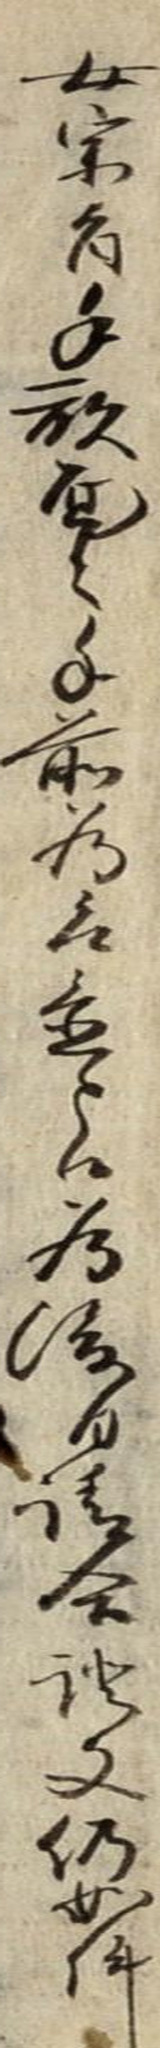女宗旨手形面々手前為取置申候為後日請合證文仍如件
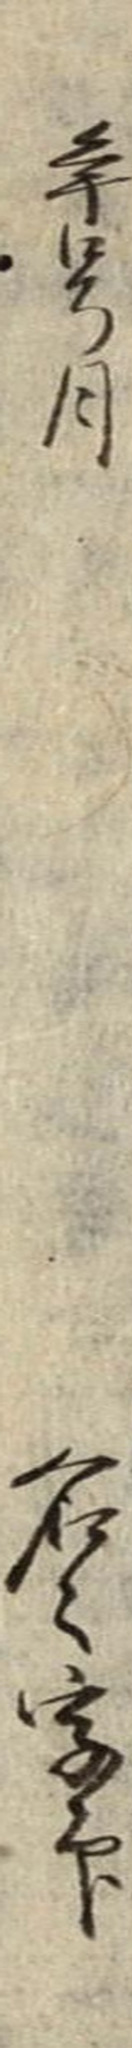年号月名と字印
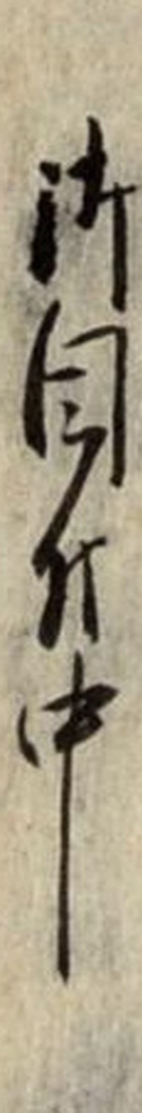御目付中
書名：三都并道中之部
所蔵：福井県文書館 Fukui Prefectural Archives
